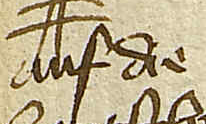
auf die
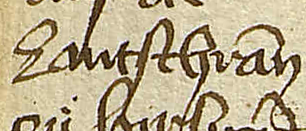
Lantſchran*
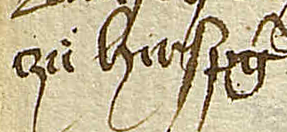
cʒü hirſpg*
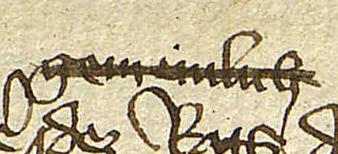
gemeinlich
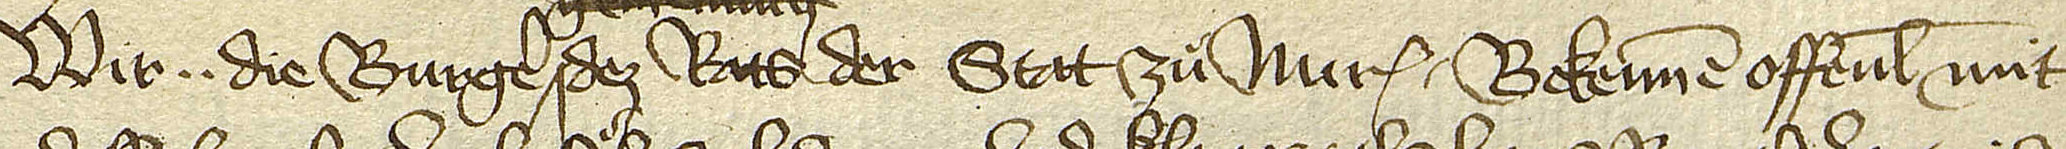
Wir ~ die Burge* deʒ Rats der Stat cʒü Nur* / Bekenne* offenl* mit
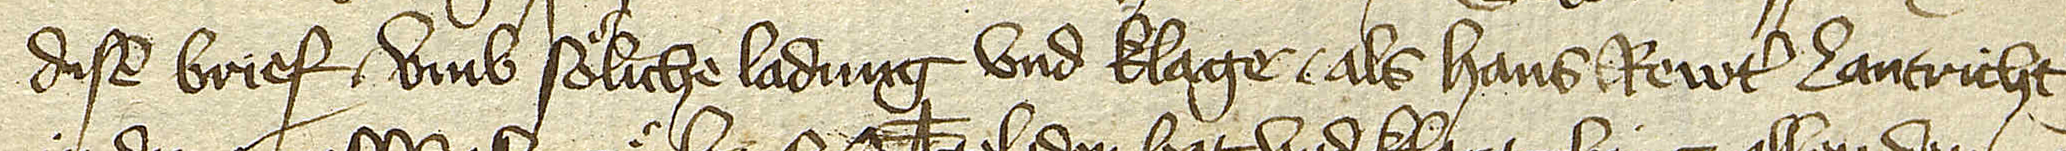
diſe* brief / vmb ſöliche ladung vnd klage / als hans Rewt* lantricht*
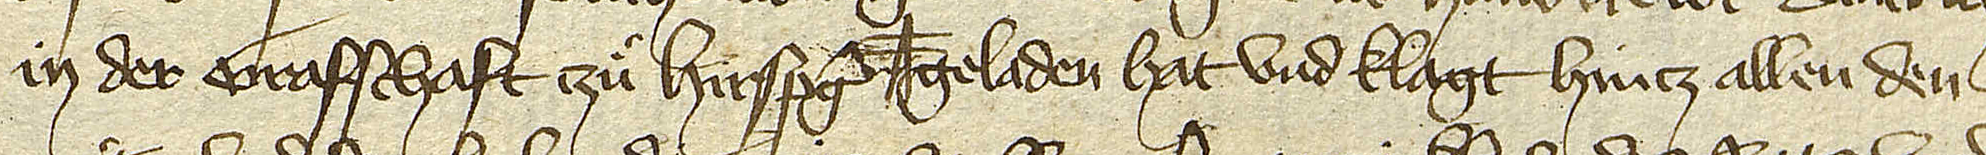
in der Grafſchaft cʒü hirſpg* / geladen hat vnd klagt hincʒ allen den
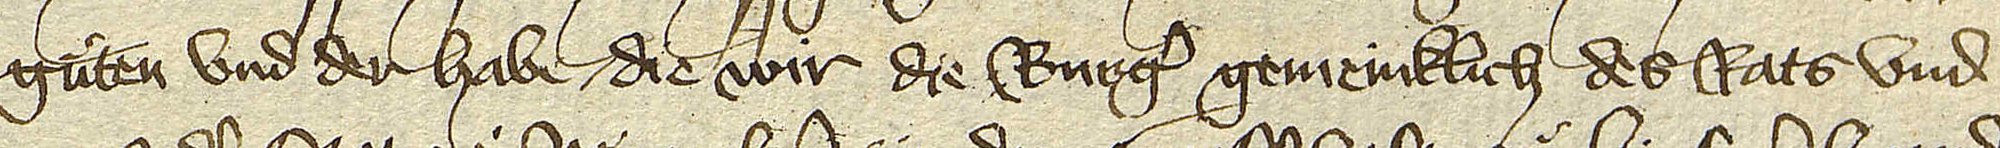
güten vnd der habe / die wir die Burg* gemeinklich des Rats vnd
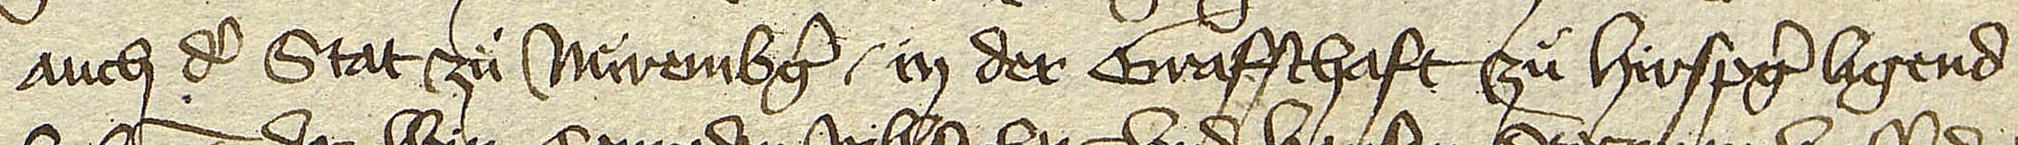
auch d* Stat cʒü Nürembg* / in der Grafſchaft cʒü hirſpg* ligend
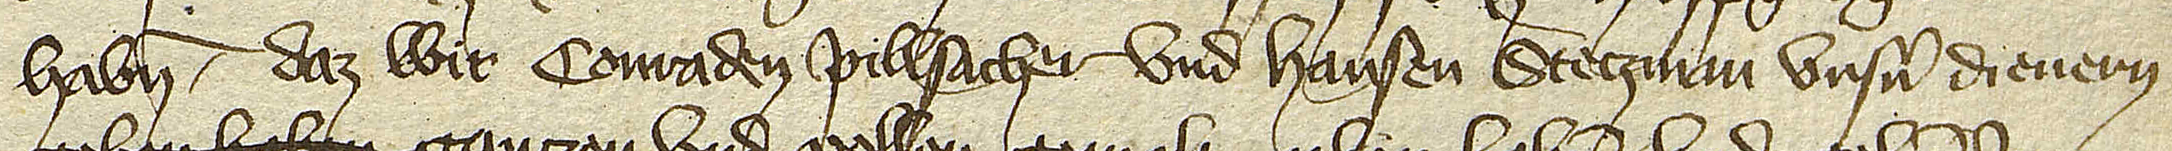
habn* / daʒ wir Conraden Pillſacher vnd hanſen Stecʒman vnſn* dienern
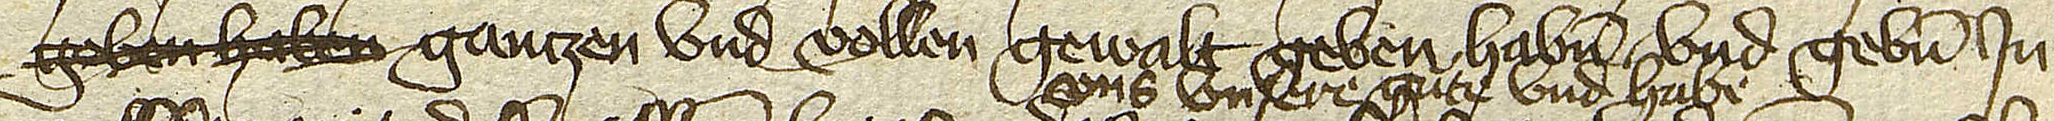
geben haben gancʒen vnd vollen gewalt geben habn* / vnd gebn* In
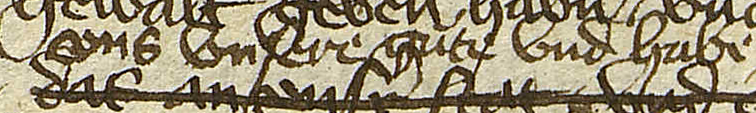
vns vnſere güte vnd habe
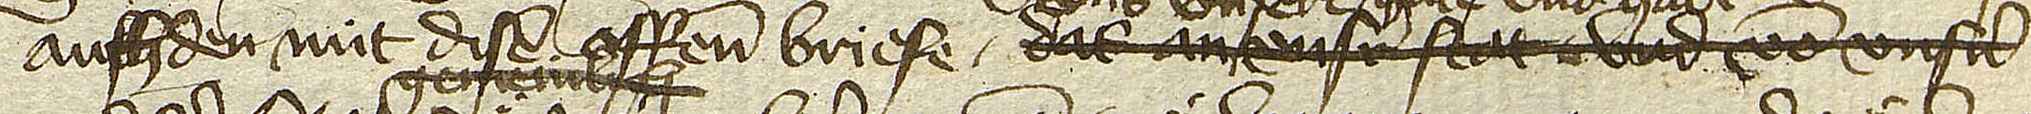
auch den mit diſe* offen* briefe / das an vnſr* ſtat / vnd vo* vnſn*
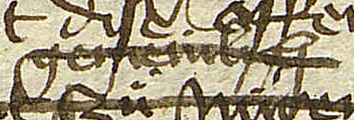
gemeinlich
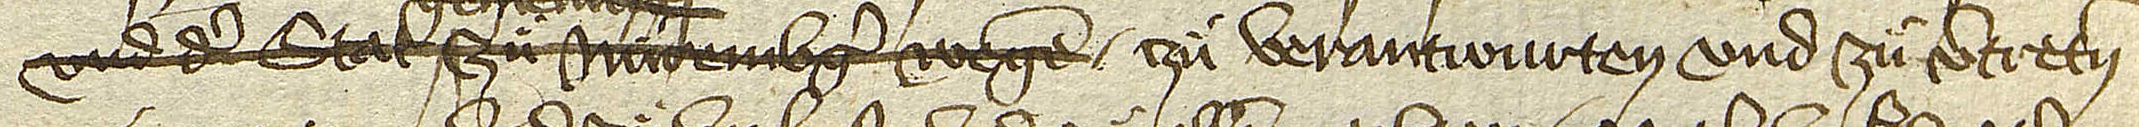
vnd d* Stat cʒü Nürembg* wege* / cʒü verantwurten vnd cʒü v*tret*n
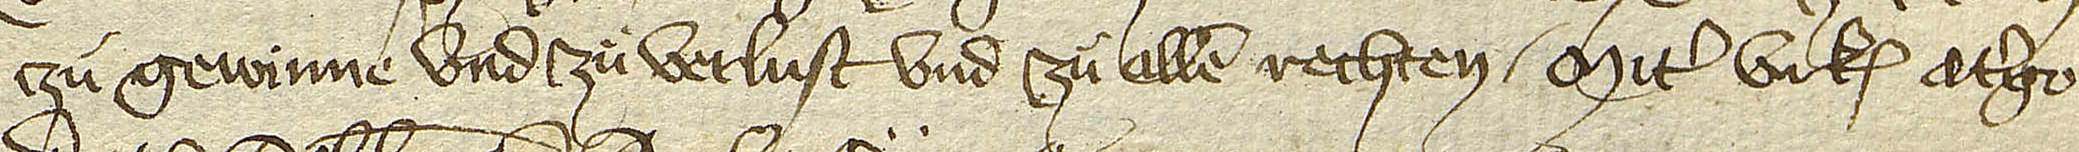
cʒü gewinne vnd cʒü verluſt vnd cʒü alle* rechten / Mit vrk* at*go
